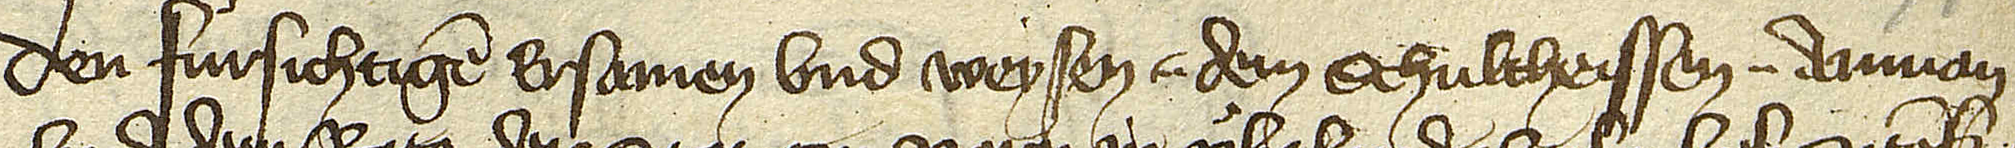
Den fürſichtige* Erſamen vnd weyſen / ~ dem Schultheiſſen ~ Arman
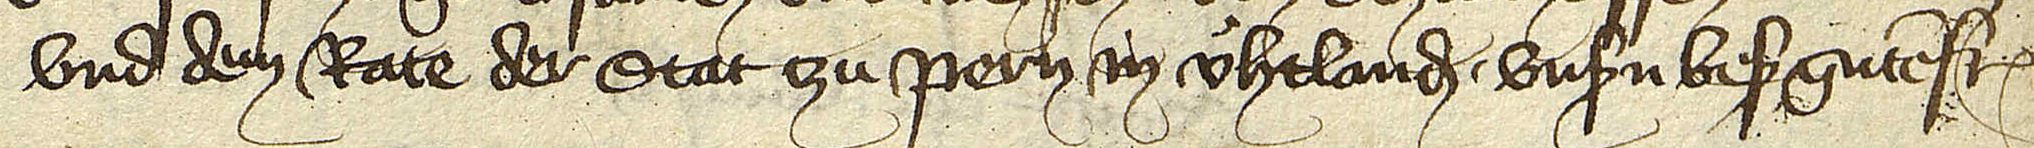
vnd dem Rate der Stat cʒu Pern in v̈htland / vnſ*n beſ* gute* fr*
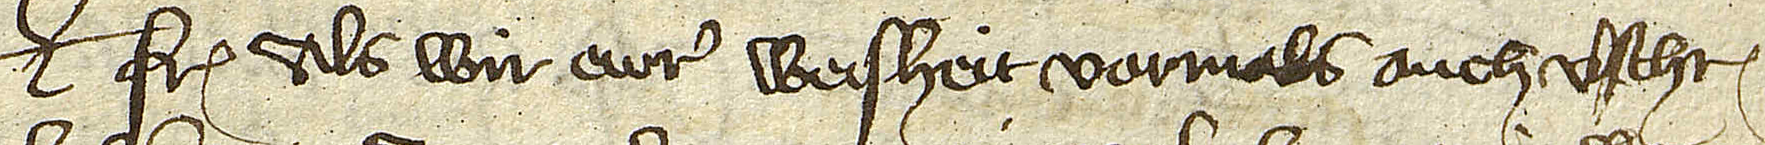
L* fr* Als wir ewr* weiſheit vormals auch v*ſchr*
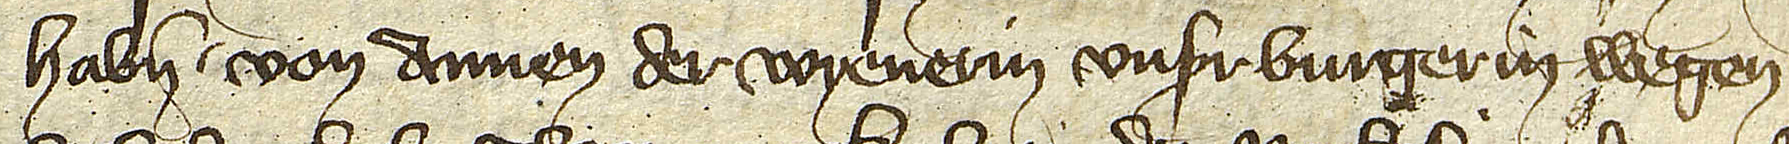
habn* / von Annen der wyenerin vnſ*r burgerin in wegen
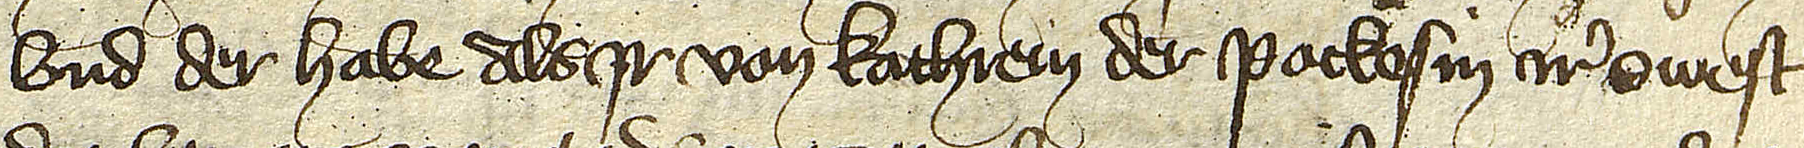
vnd der habe Als Ir von Kathrein der Packeſin ir* Sweſt*
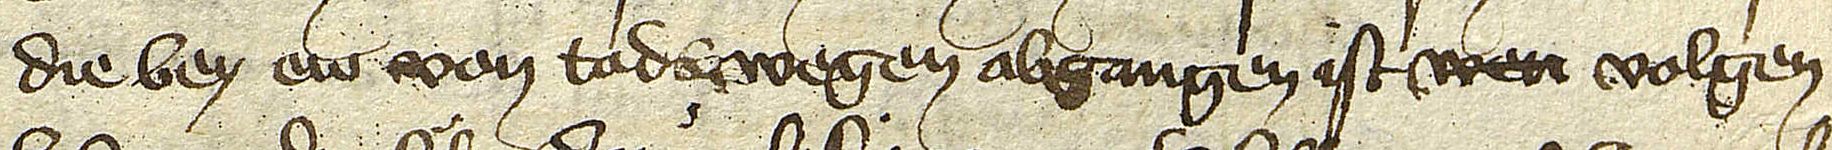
die bey ew von tods wegen abgangen iſt wen volgen
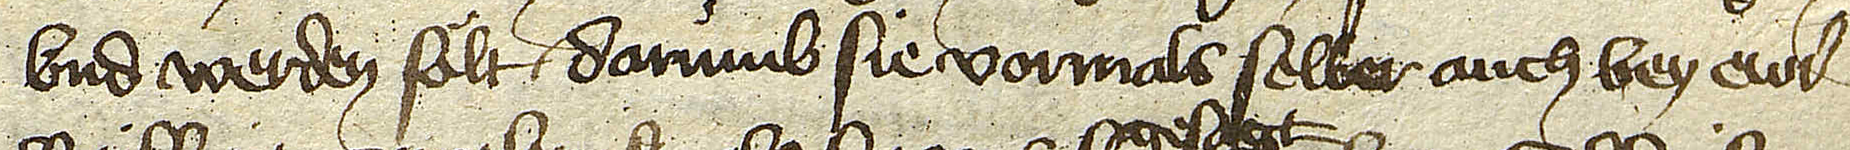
vnd werden ſölt / darümb ſie vormals ſelber auch bey ewr*
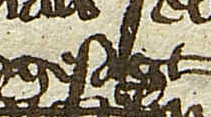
geſagt
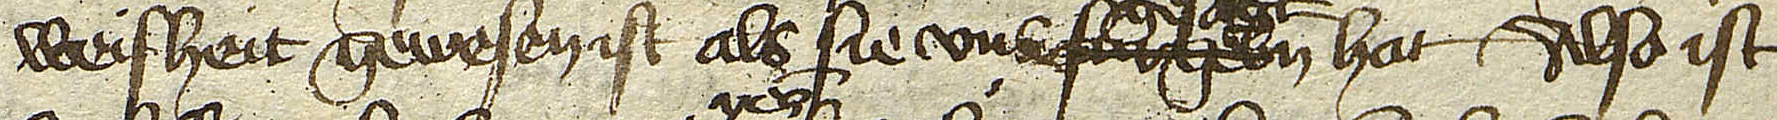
weiſheit geweſen iſt als ſie vns fürgebn* hat / Alſo iſt
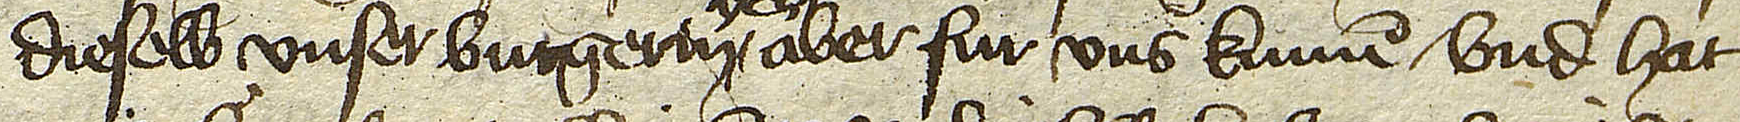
dieſelb vnſer burgerin aber für vns kume* / vnd hat
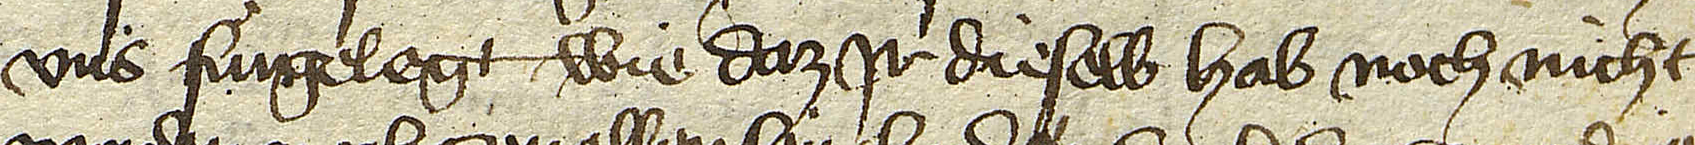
vns fürgelegt / wie daʒ Ir dieſelb hab noch nicht
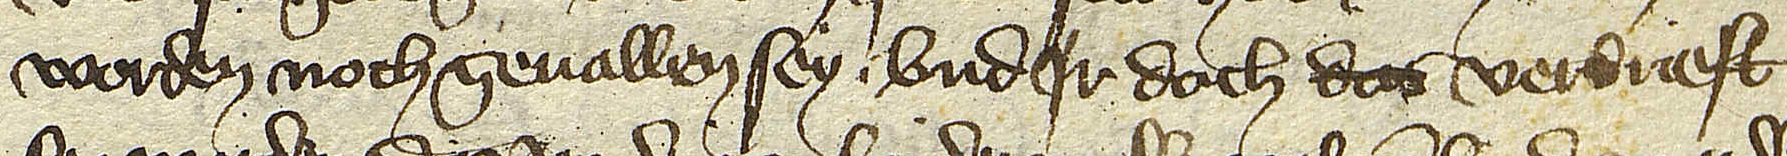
worden noch geuallen ſey / vnd Ir doch das verbrieft
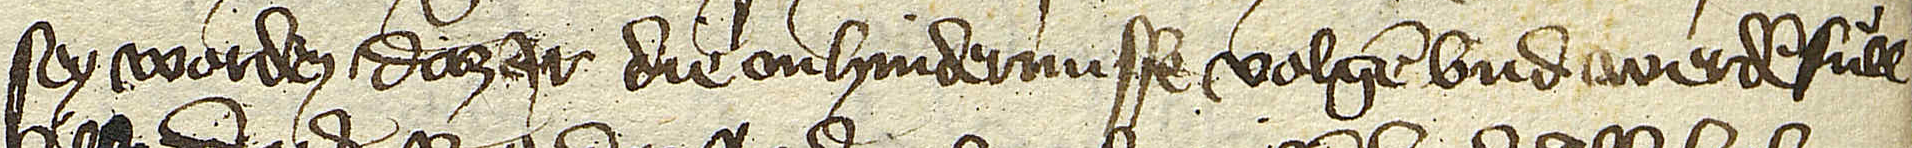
ſey worden / daʒ Ir die onhindernuſſe volge* vnd werde* ſüll
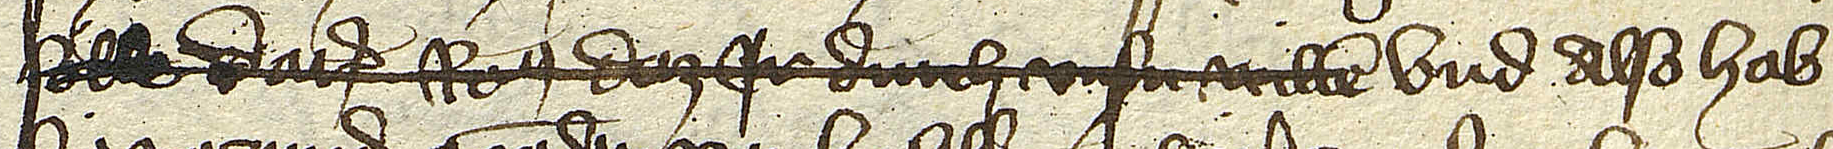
ſölle Dar* Ro* daʒ Ir durch vnſ*n wille* vnd Alſo hab
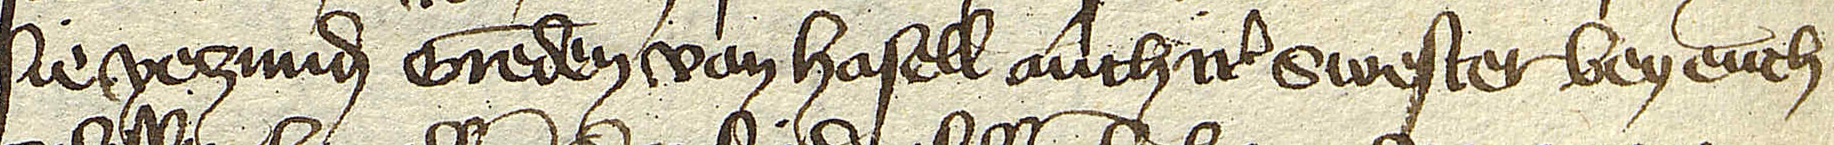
ſie yecʒund* Greden von haſell auch ir* Sweſter bey euch
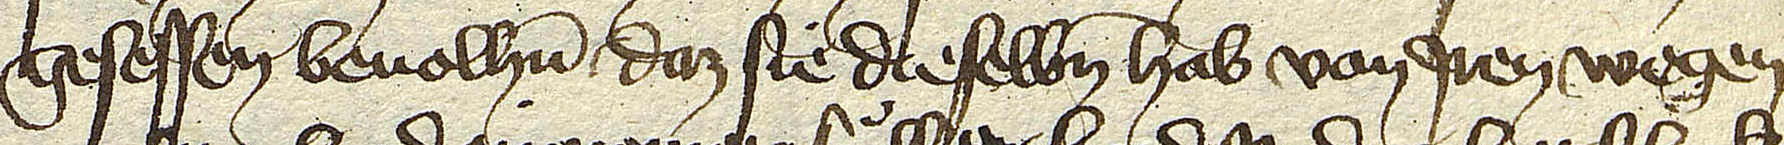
geſeſſen beuolhn* / daʒ ſie dieſelbn* hab von Iren wegen
